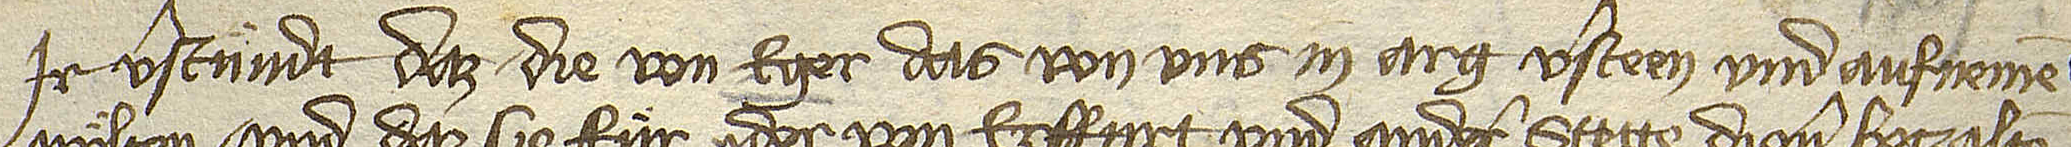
Ir v*ſtündt daʒ / die von Eger das von vns in arg v*ſteen vnd aufneme*
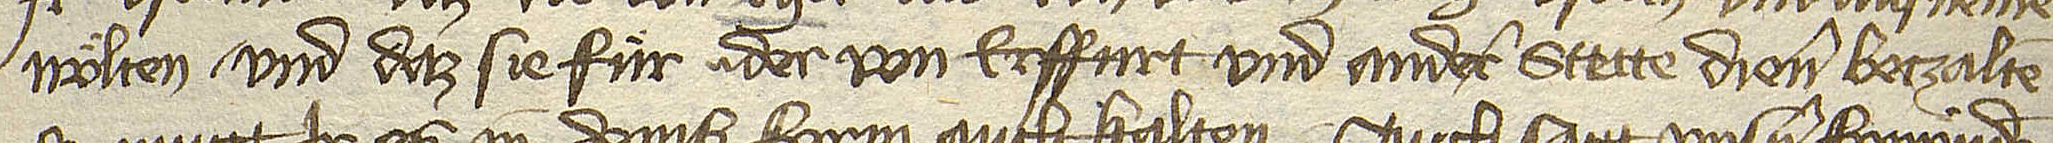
wölten / vnd daʒ ſie für ~ der von Erffurt vnd ander* Stette dien* becʒalte*
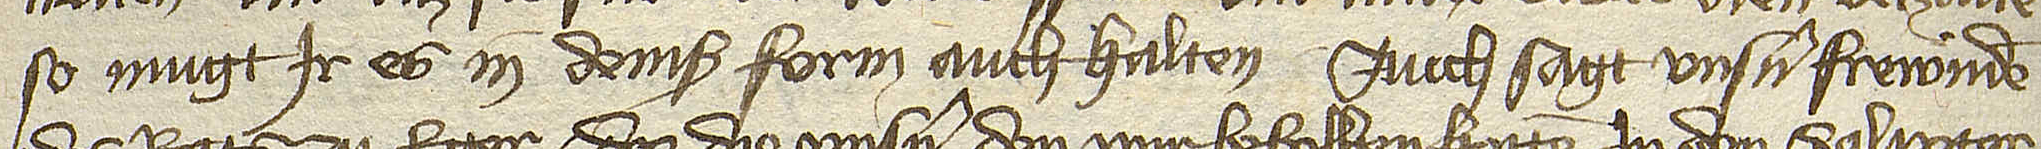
ſo mugt Ir es in demſ* form auch halten Auch ſagt vnſn* freẅnde*
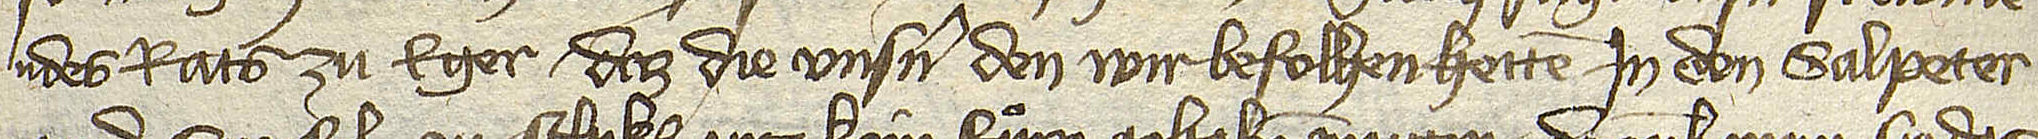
~ des Rats ʒu Eger / daʒ die vnſn* den vor befolhen hette* In den Salpeter
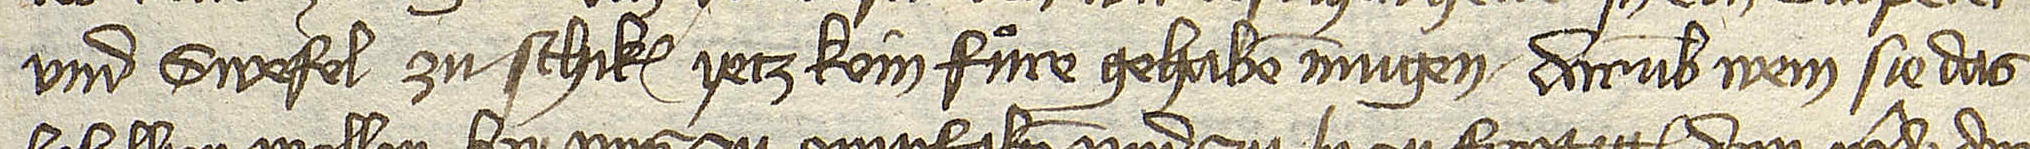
vnd Swefel ʒu ſchik* yecʒ kein füre gehabe* mugen / darub* wem ſie das
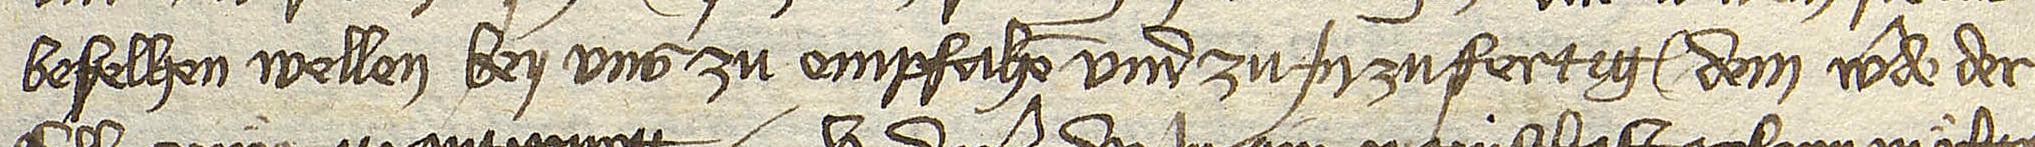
befelhen wellen bey vns cʒu empfahe* vnd ʒu In ʒu fertig* / denn w*de der
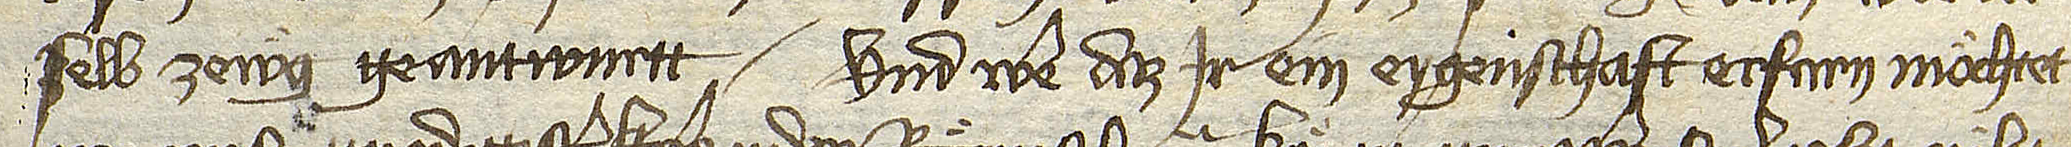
ſelb ʒeẅg geantwurtt / vnd w*e daʒ Ir ein eygenſchaft erfarn möchtet
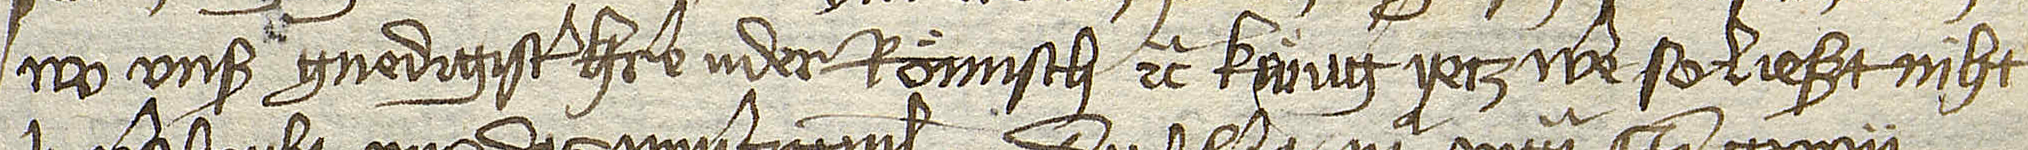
wo vnſ* gnedigiſt* hr*e ~ der Römiſch* ec* künig yecʒ w*e ſo lieſʒt niht
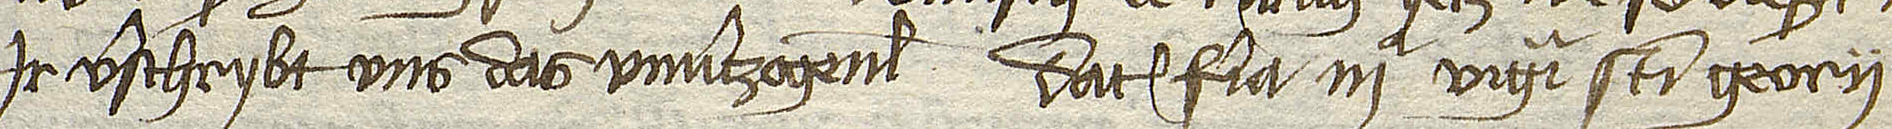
Ir v*ſchrybt vns das vnu*cʒogenl* Dat* fia* iii* vigi* ſci* georii
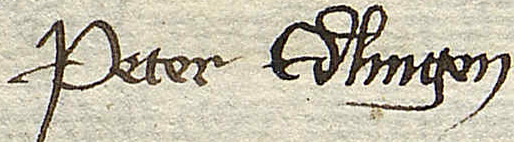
Peter Edlingen
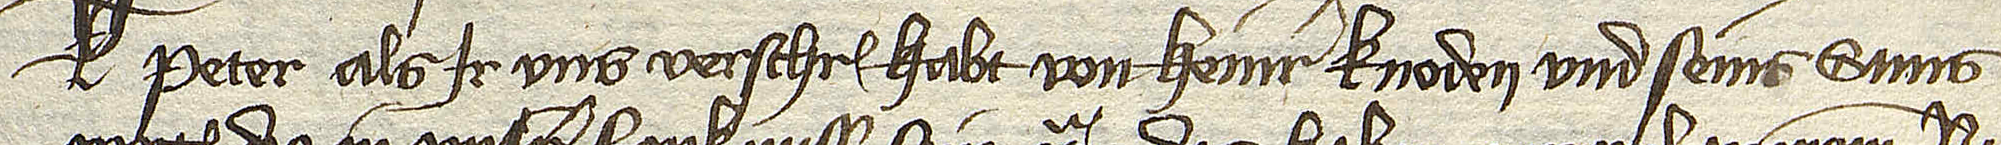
L* Peter als Ir vns verſchr* habt von heinr* Knoden vnd ſeins* Suns
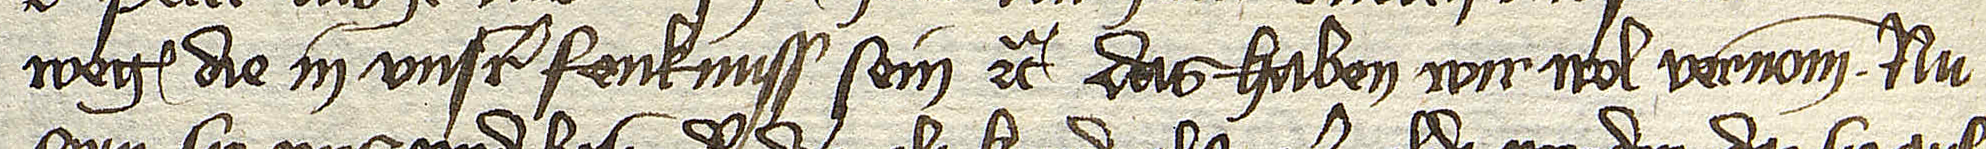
weg* die in vnſr* fenknuſſ ſein ec* das haben wir wol vernom* . Nu
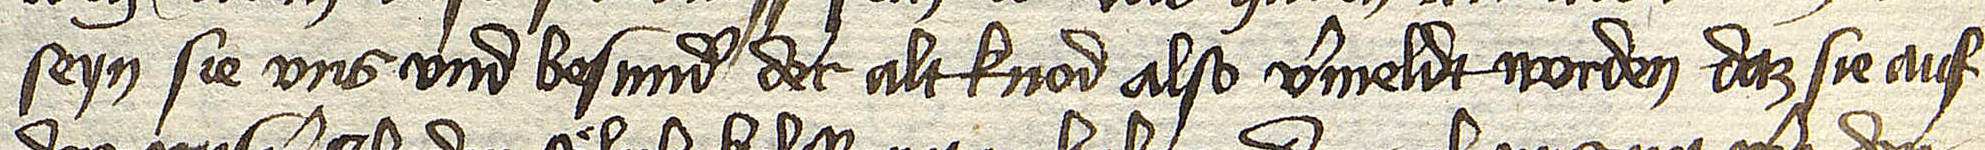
ſeyn ſie vns vnd beſund* der alt knod alſo v*meldt worden daʒ ſie auf
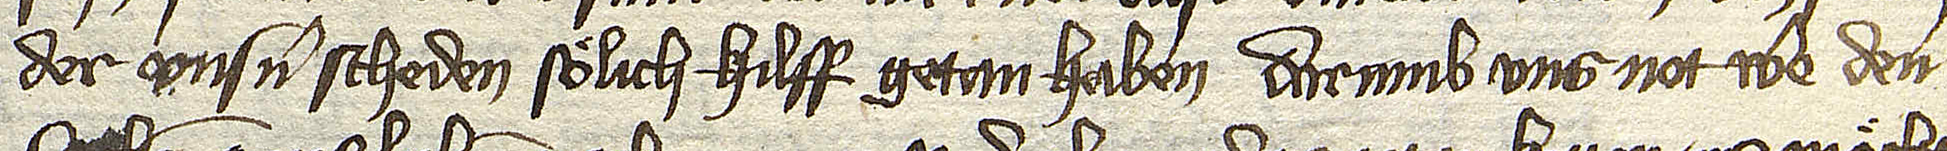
der vnſn* ſcheden ſölich hilff getan haben darumb vns not w*e den
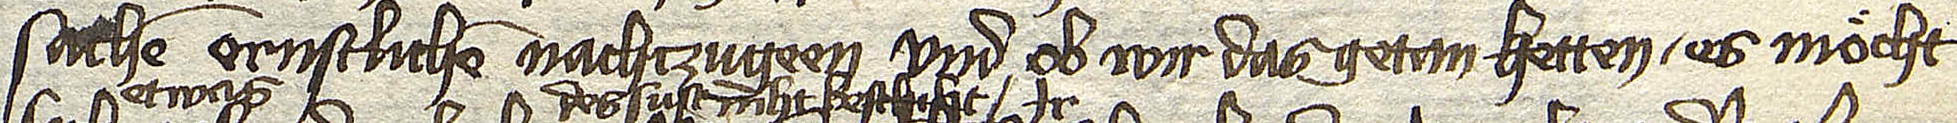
ſache* ernſtliche* nachcʒugeen vnd ob wir das getan hetten / es möcht
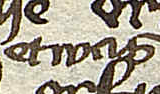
etwas
